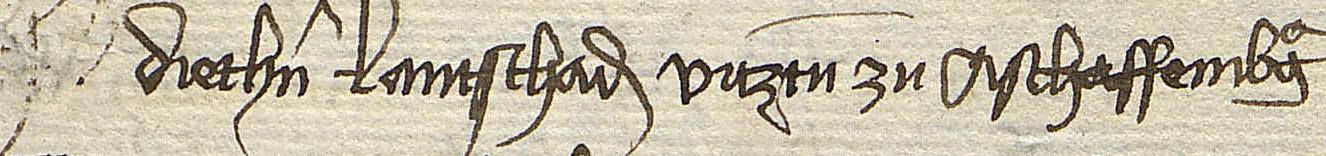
dieth*n lantſchad* vicʒtu* ʒu Aſchaffemb*g
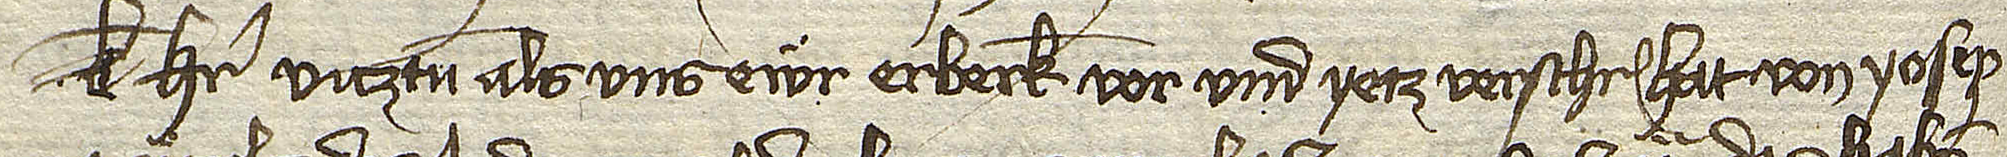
L* Hr* vicʒtu* als vns eẅr erberk* vor vnd yecʒ verſchr* hat von yoſep
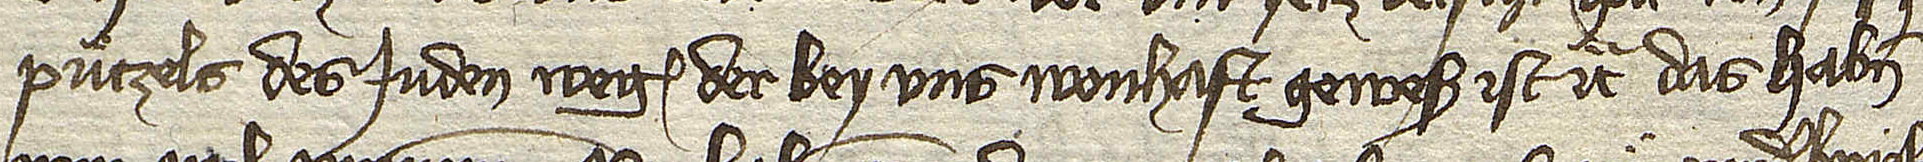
pücʒels des Iuden weg* der bey vns wonhaft geweſ* iſt ec* das habn*
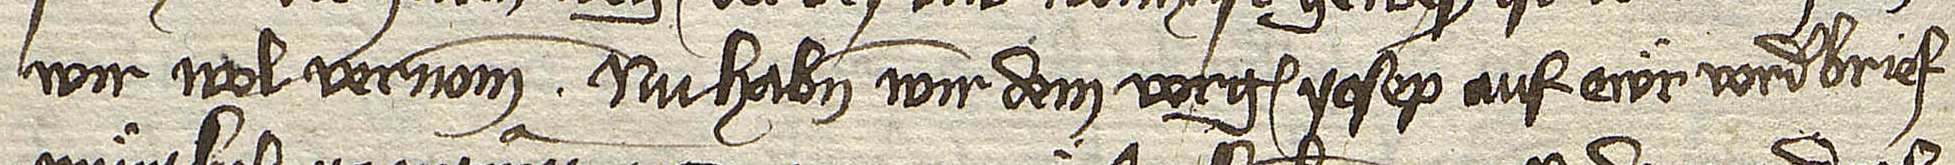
wir wol vernom* . Nu habn* wir dem vorg* yoſep auf eẅr vord* brief
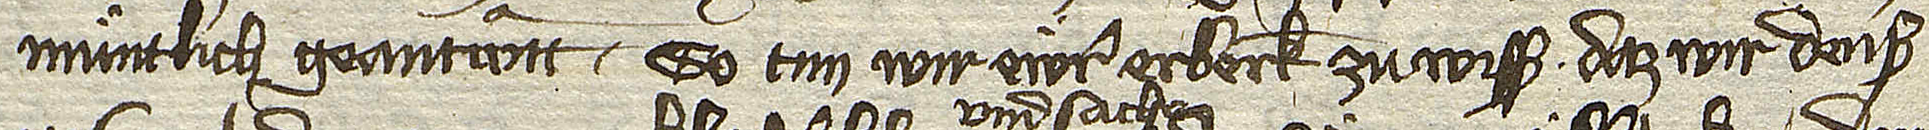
müntlich geantw*tt / So tun wir eẅr* erberk* ʒu wiſſ* . daʒ wir denſ*
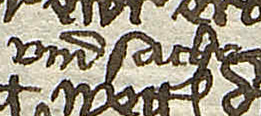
vnd ſachen
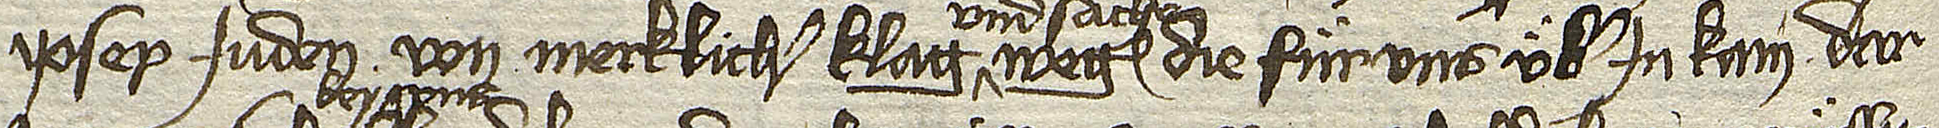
yoſep Iuden . von merklich* klag weg* die für vns v̈b* In kam dar
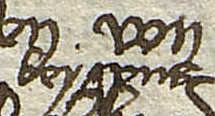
bey vns
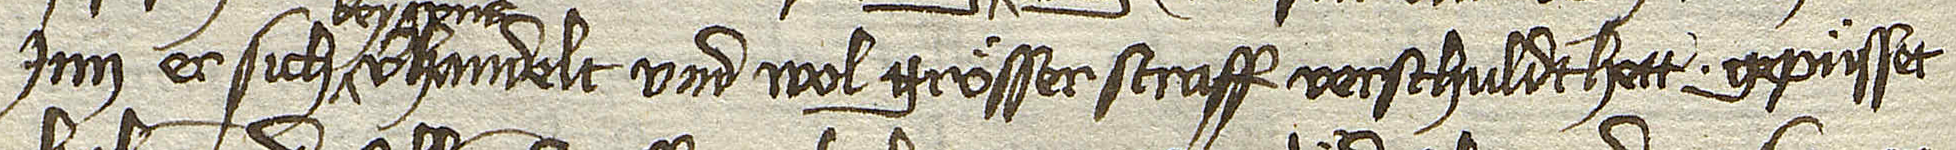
Inn er ſich v*handelt vnd wol gröſſer ſtraff verſchuldt hett . gepüſſet
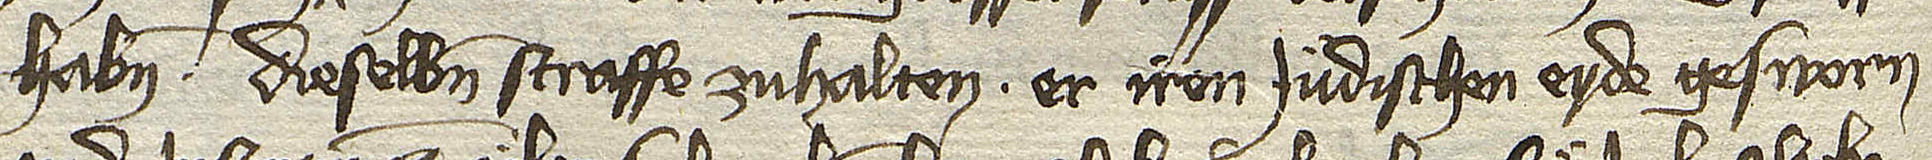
habn* . Dieſelbn* ſtraffe ʒuhalten . er iren Iüdiſchen eyde geſworn
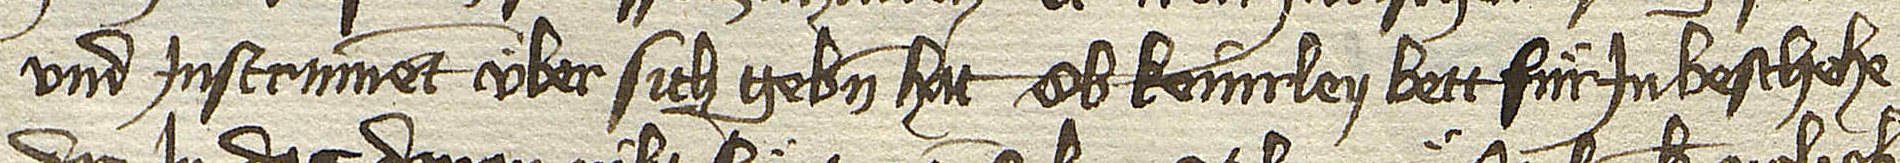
vnd Inſtrume*t v̈ber ſich gebn* hat / Ob keinrley bett für In beſchehe
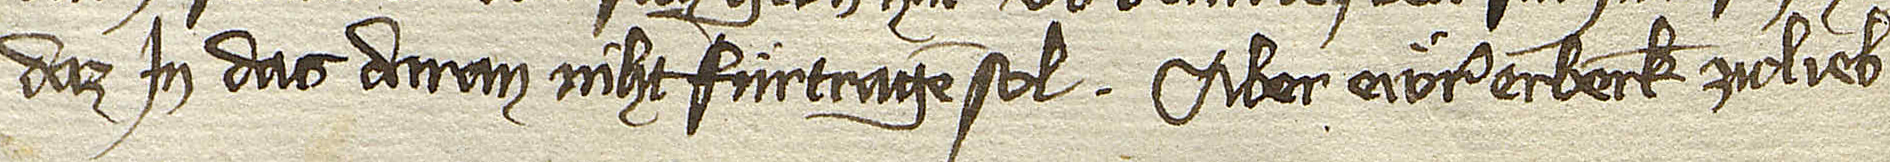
daʒ In das daran niht fürtrage* ſol . Aber eẅr* erberk* ʒulieb
